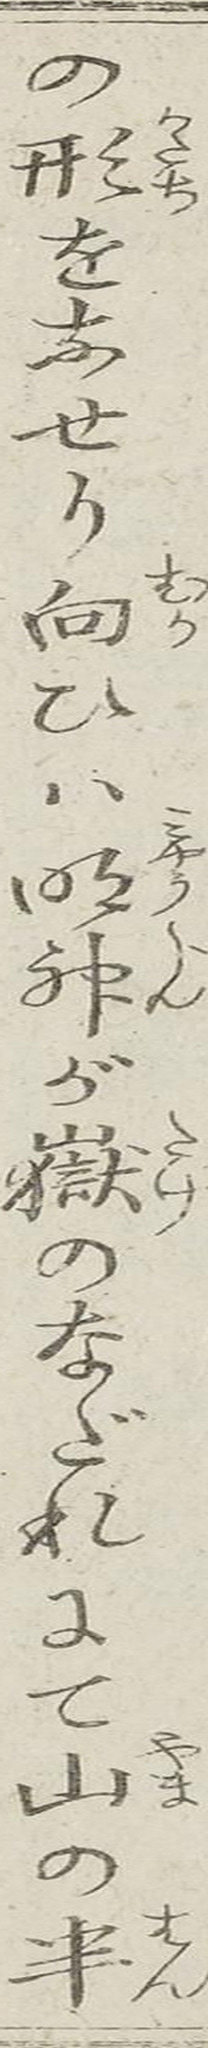の形をなせり向ひは明神が嶽のながれにて山の半
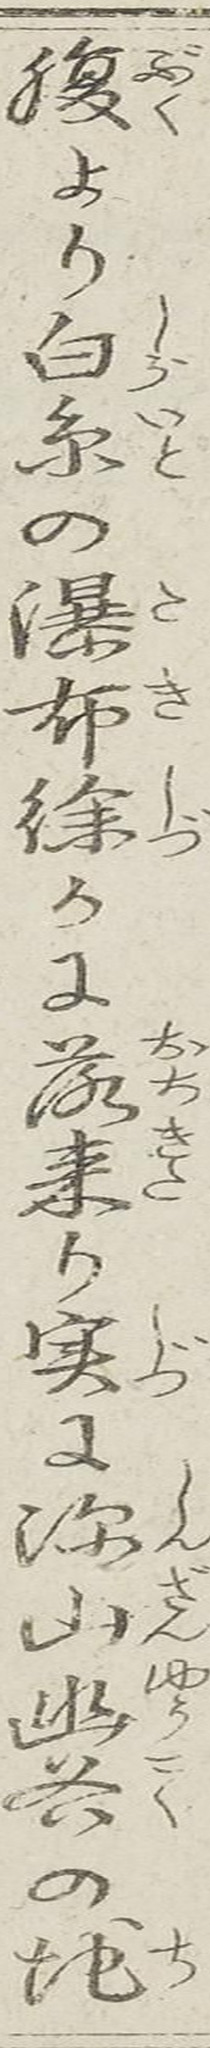腹より白糸の瀑布徐かに落来り実に深山幽谷の地
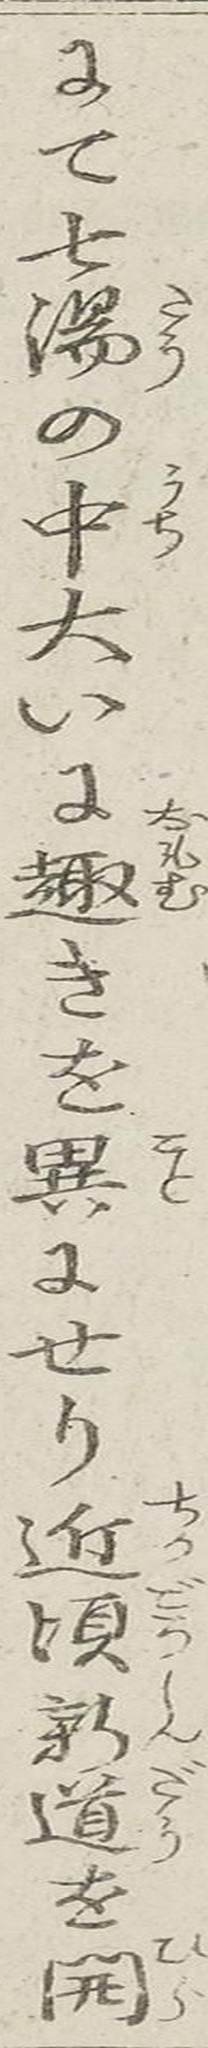にて七湯の中大いに趣きを異にせり近頃新道を開
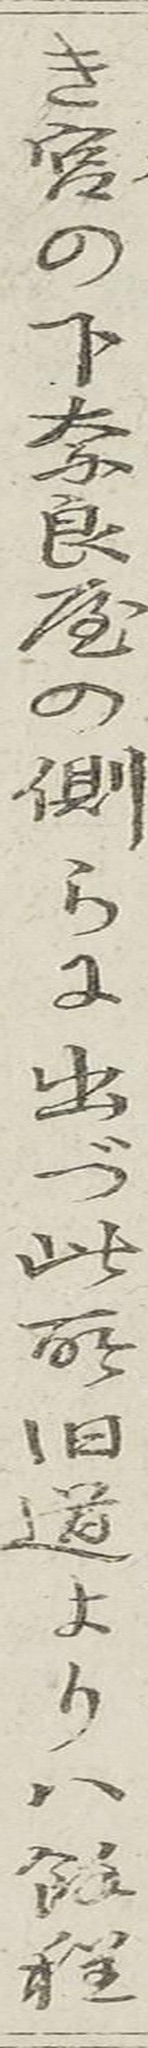き宮の下奈良屋の側らに出づ此所旧道よりは餘程
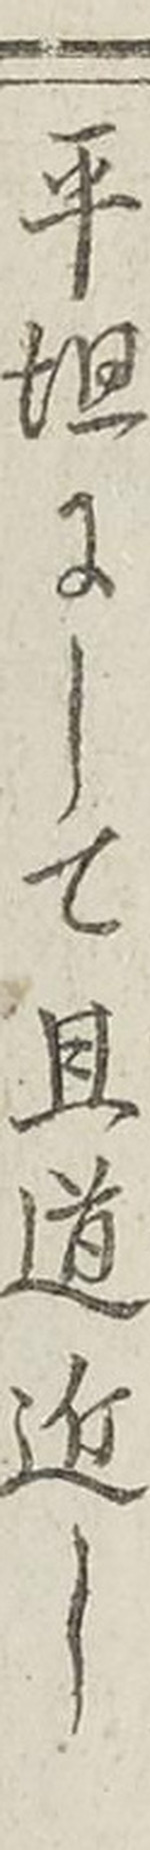平坦にして且道近し
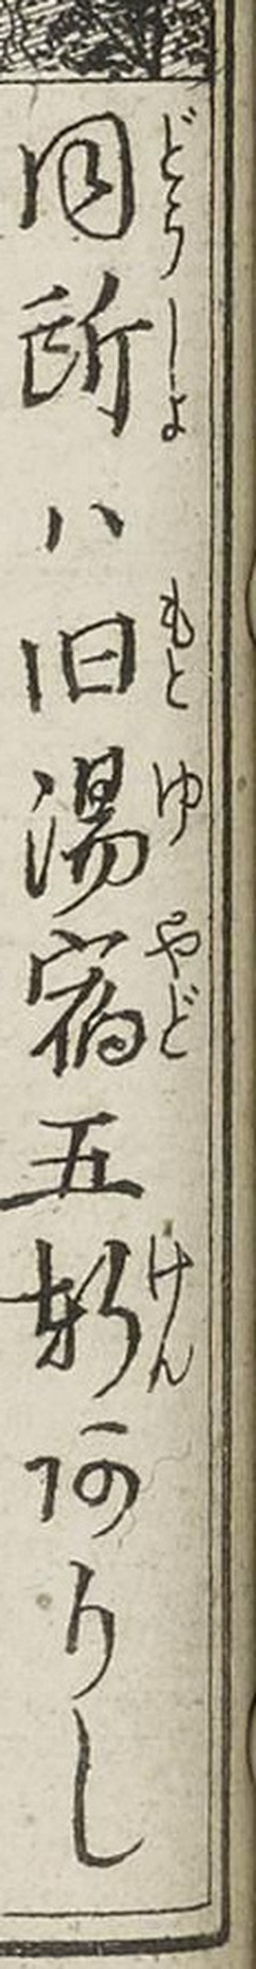同所は旧湯宿五軒ありし
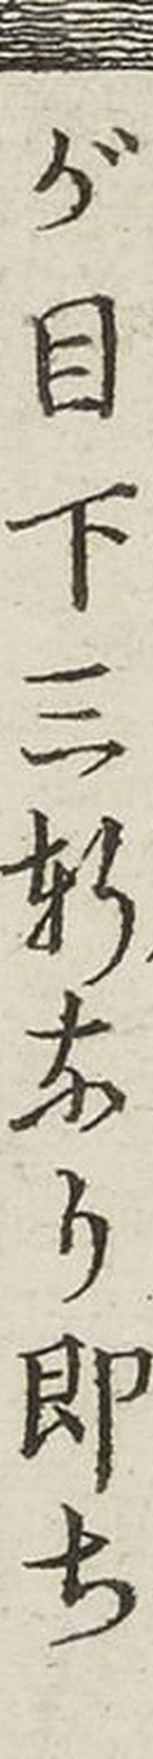が目下三軒なり即ち
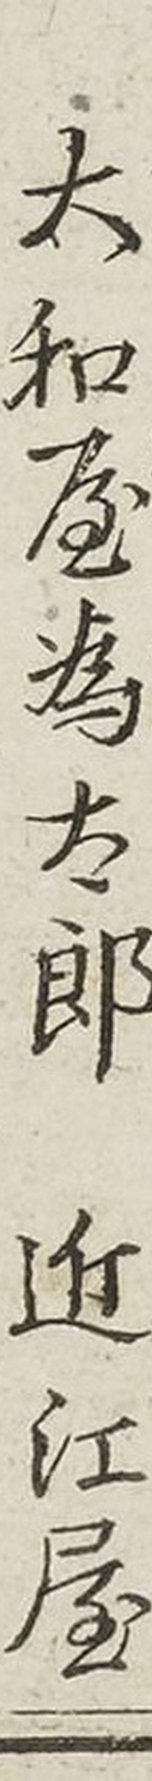大和屋為太郎近江屋
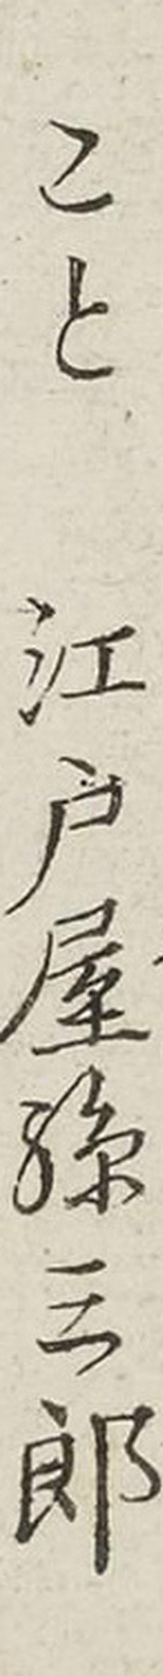こと江戸屋孫三郎
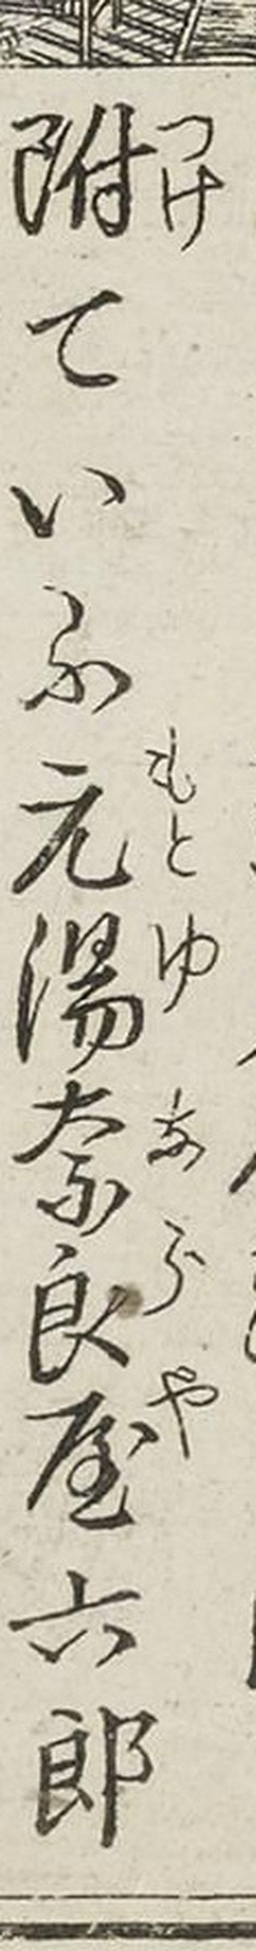附ていふ元湯奈良屋六郎
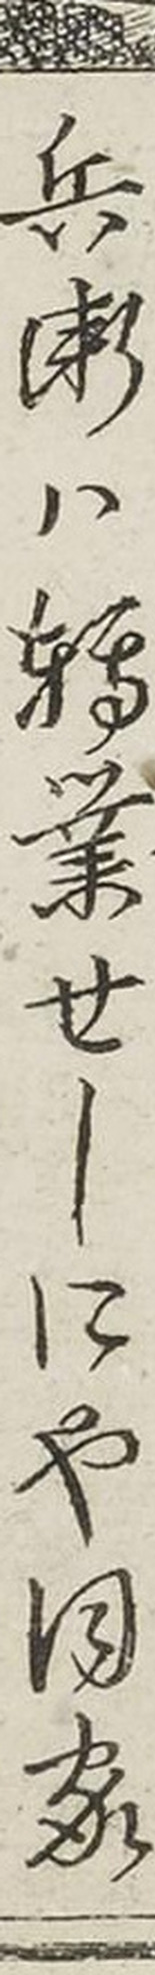兵衛は転業せしにや同家
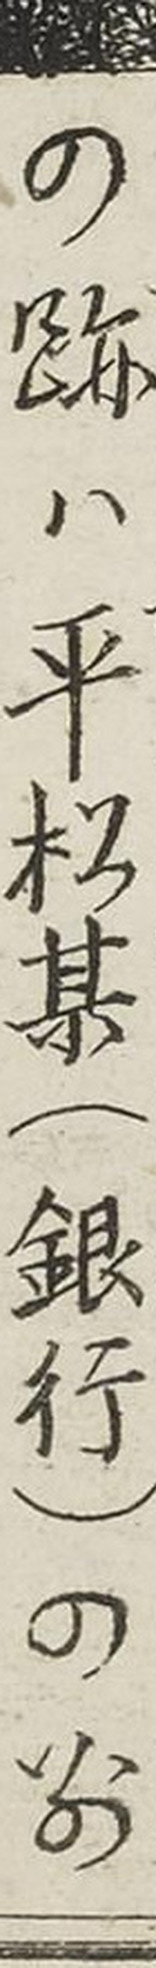の跡は平松某）の別
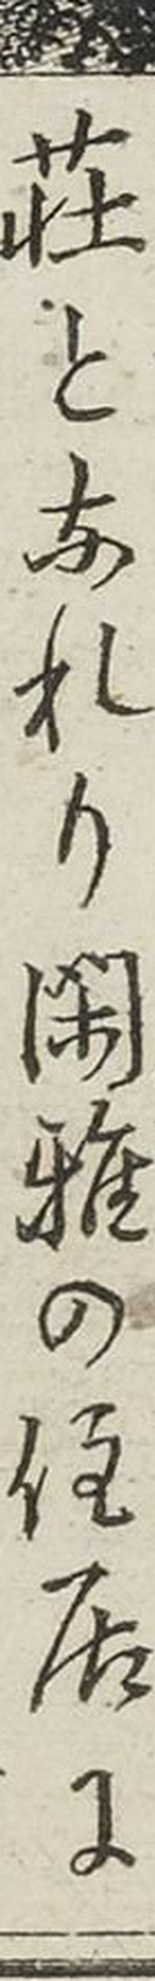荘となれり閑雅の住居に
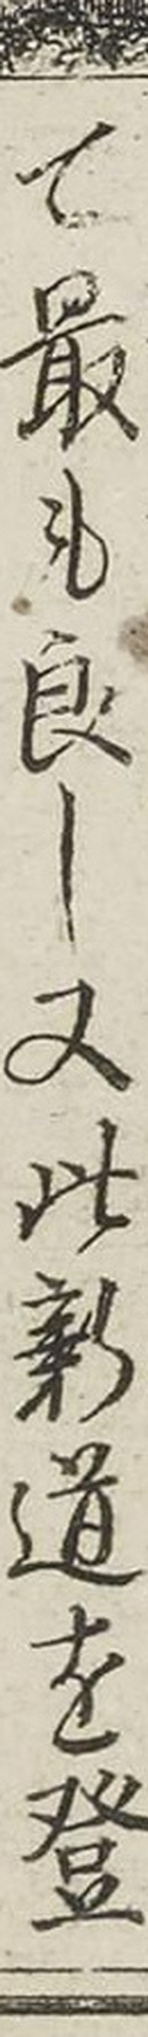て最も良し又此新道を登
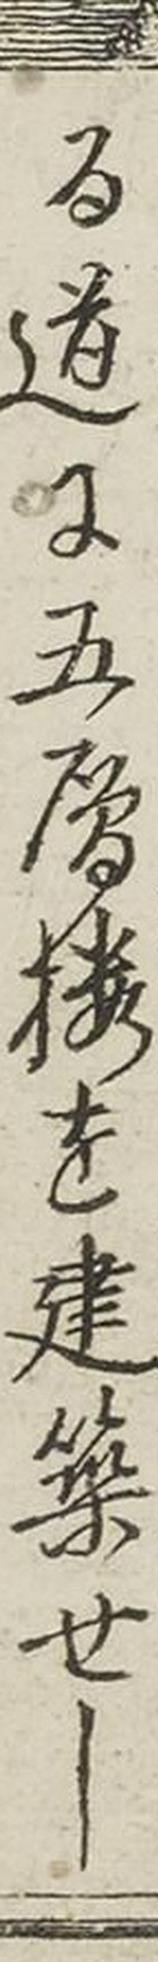る道に五層楼を建築せし

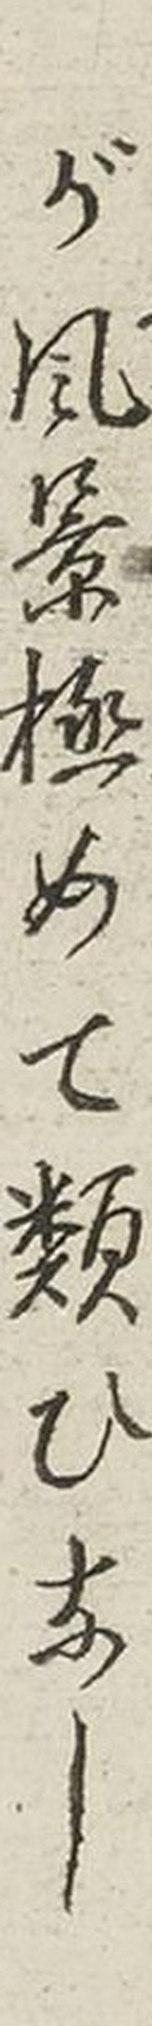が風景極めて類ひなし
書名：箱根温泉誌　全
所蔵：東京大学地震研究所図書室 Earthquake Research Institute Library, The University of Tokyo, JAPAN
